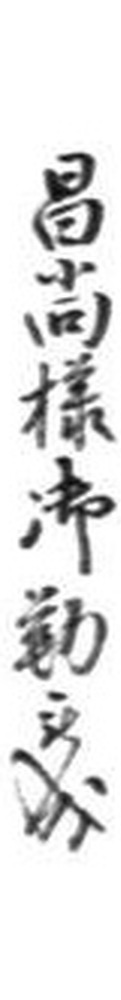昌尚様御勤被成
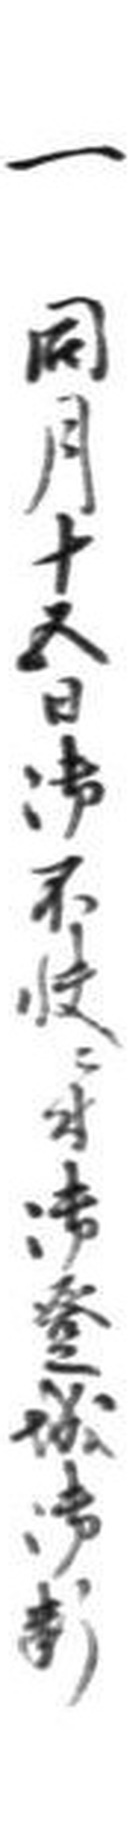一同月十五日御不快ニ付御登城御断
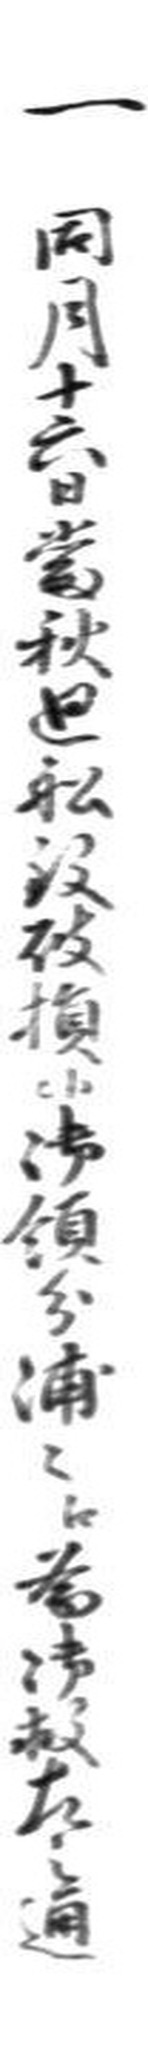一同月十六日当秋廻船致破損候御領分浦々江為御救左之通
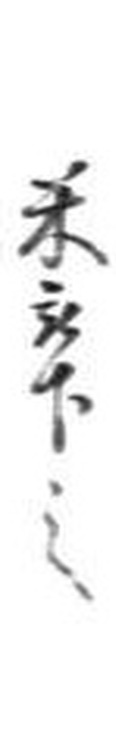米被下之
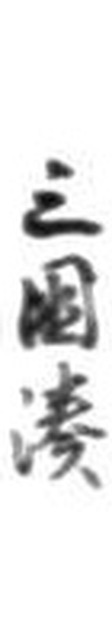三国湊
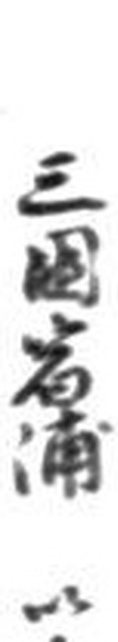三国宿浦

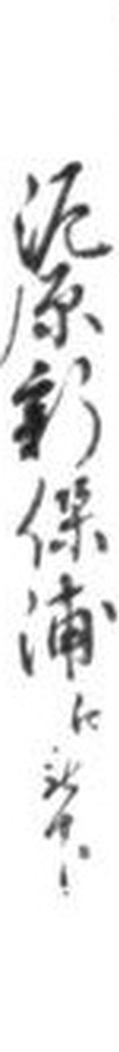泥原新保浦江被下
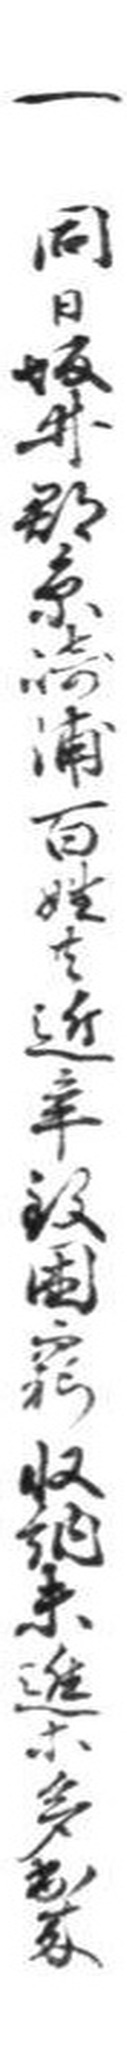一同日坂井郡糸崎浦百姓共近年致困窮収納未進等多出来
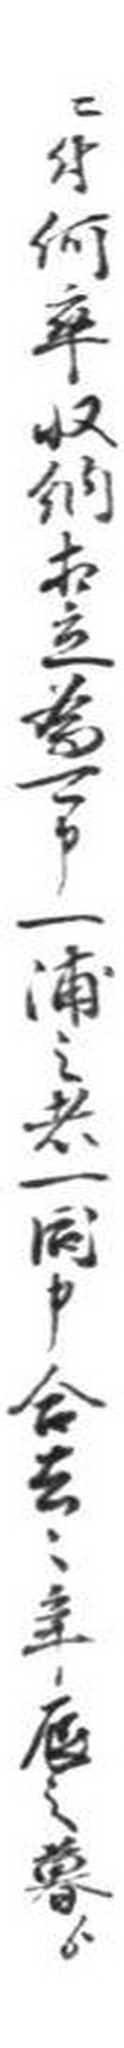ニ付何卒収納相立為可申一浦之者一同申合去々年辰之暮ゟ
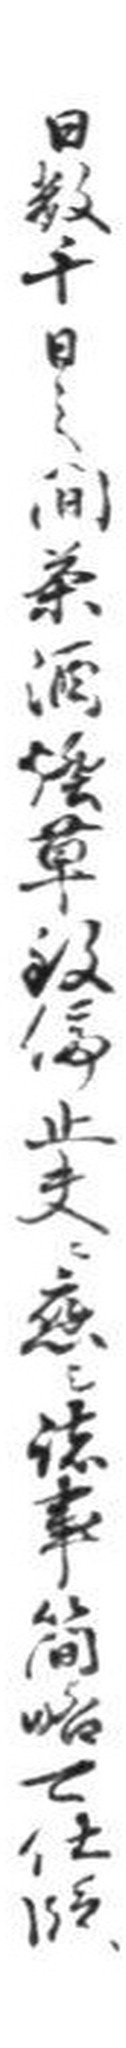日数千日之間茶酒煙草致停止夫ニ応シ諸事簡略可仕段
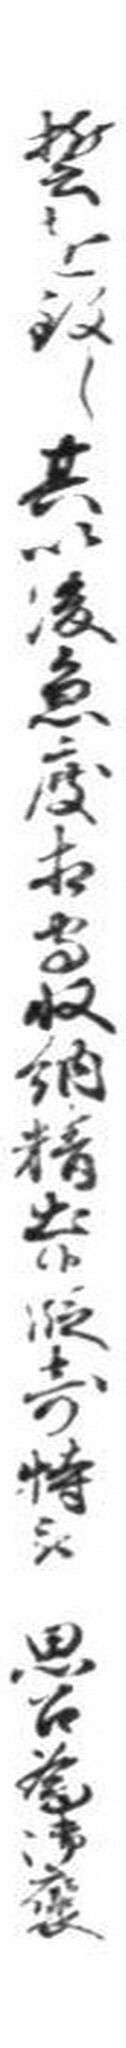誓を致し其以後急度相守収納精出候段奇特被思召為御褒
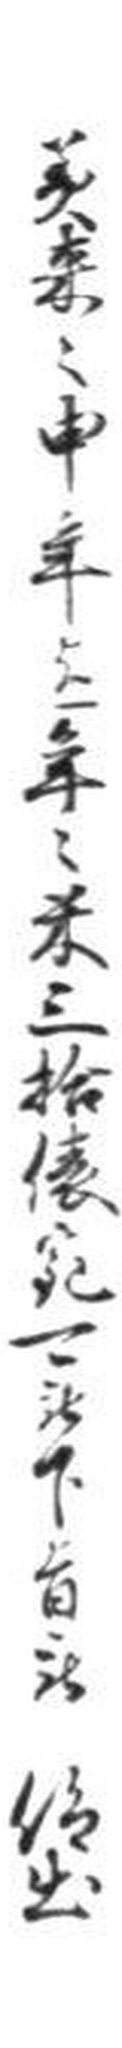美来々申年迄年々米三拾俵宛可被下旨被仰出
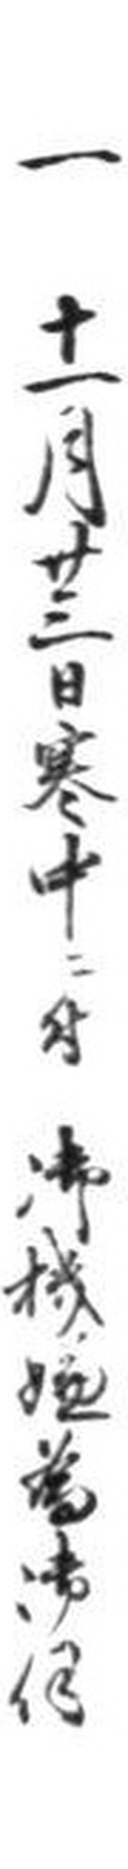一十一月廿三日寒中ニ付御機嫌為御伺
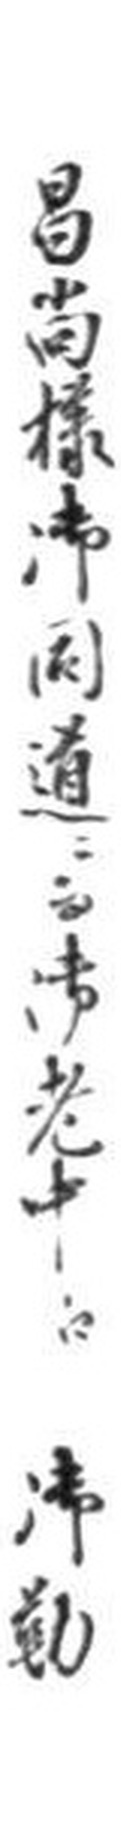昌尚様御同道ニ而御老中江御勤
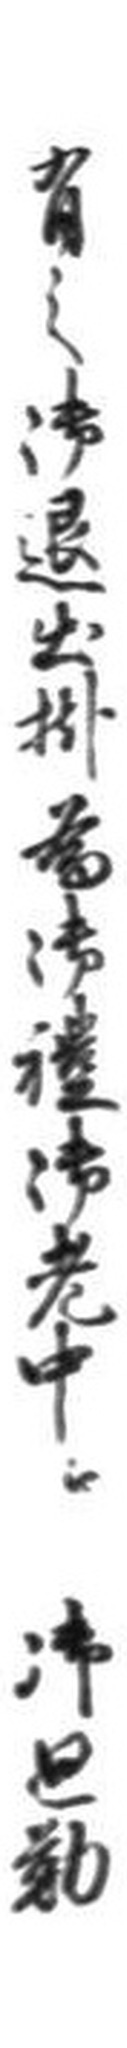有之御退出掛為御礼御老中江御廻勤
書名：家譜 二十二 吉品公 従元禄十五年到同十六年
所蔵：福井県文書館 Fukui Prefectural Archives
